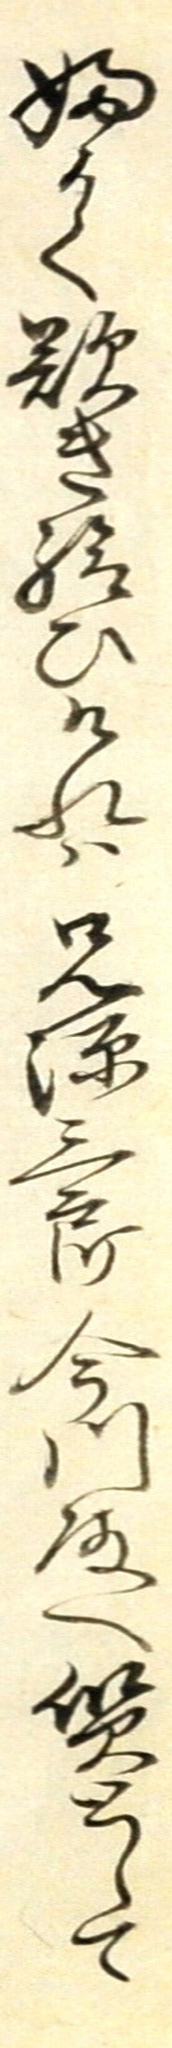ふかく歎き給ひけれは兄源三郎今川殿へ質として
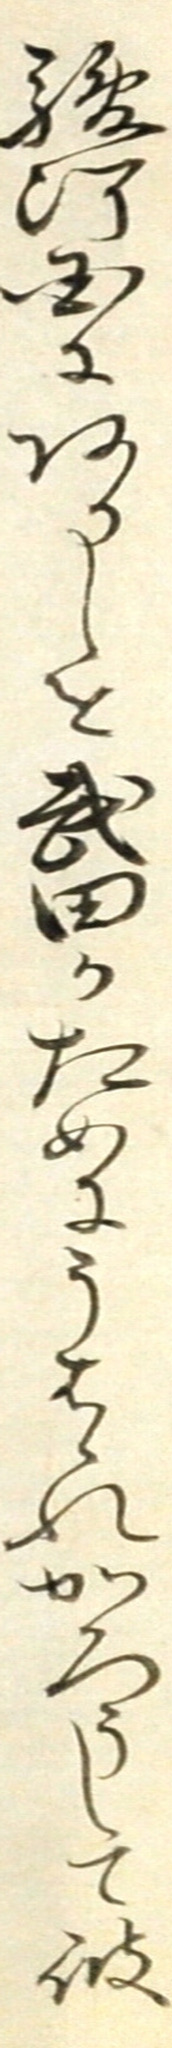駿河国にありしを武田かためにうたれかろうして彼
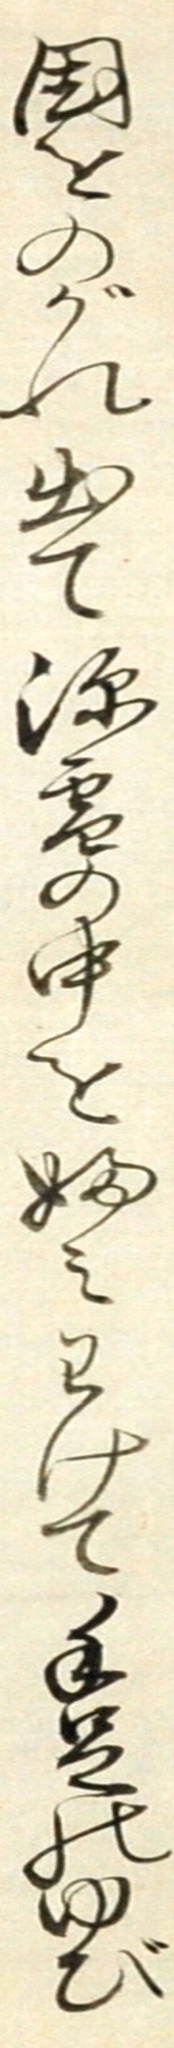国をのがれ出て深雪の中をふみわけて手足のゆび
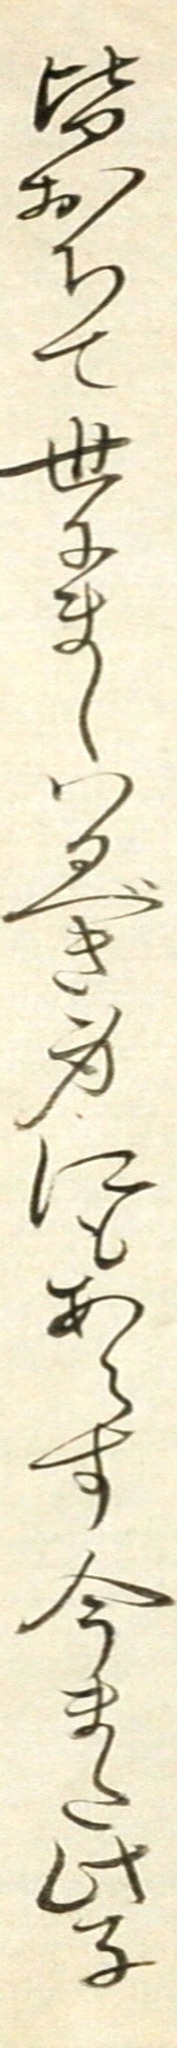皆おちて世にましはるべき身にもあらす今また此子
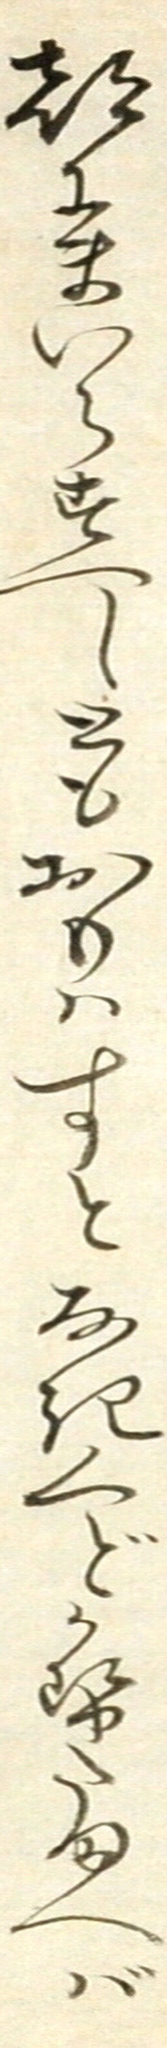都にまいらすへしともおもはすとなきくどかせたまへば
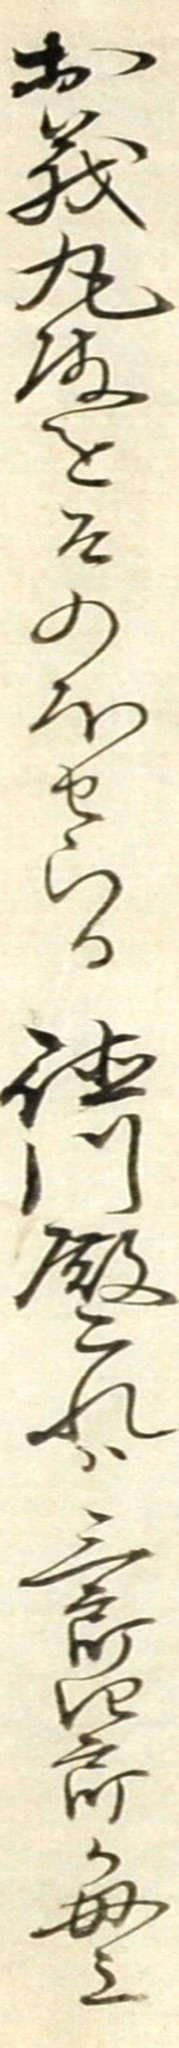お義丸殿をそのほせらる徳川殿これは三郎四郎か母上
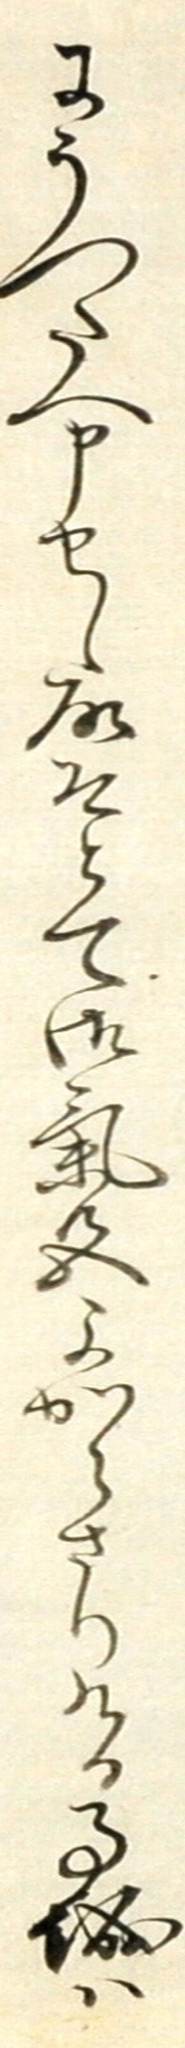にうつたへ申せし故そとて御気色よからさりける事誠は
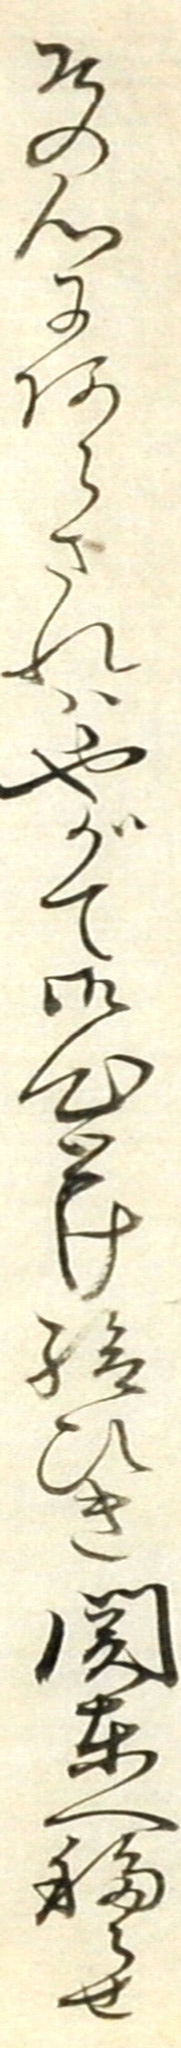その心にあらされはやがて御心とけ給ひき関東へ移らせ
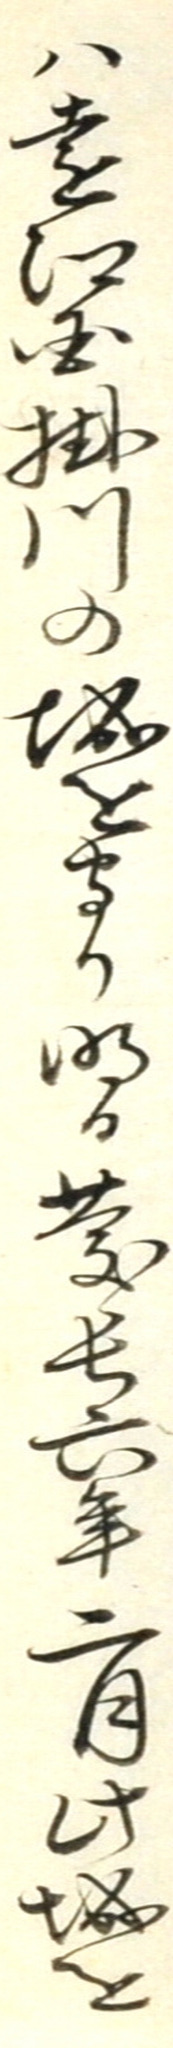は遠江国掛川の城を守り明る慶長六年二月此城を
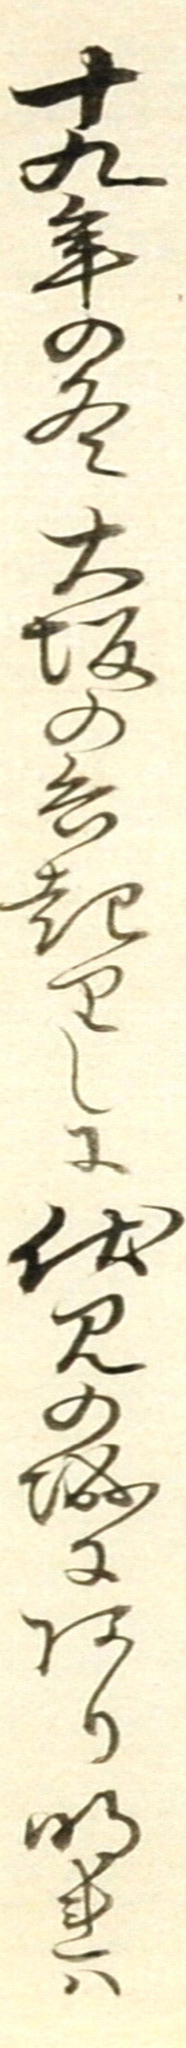十九年の冬大坂の兵起りしに伏見の城にあり明れは
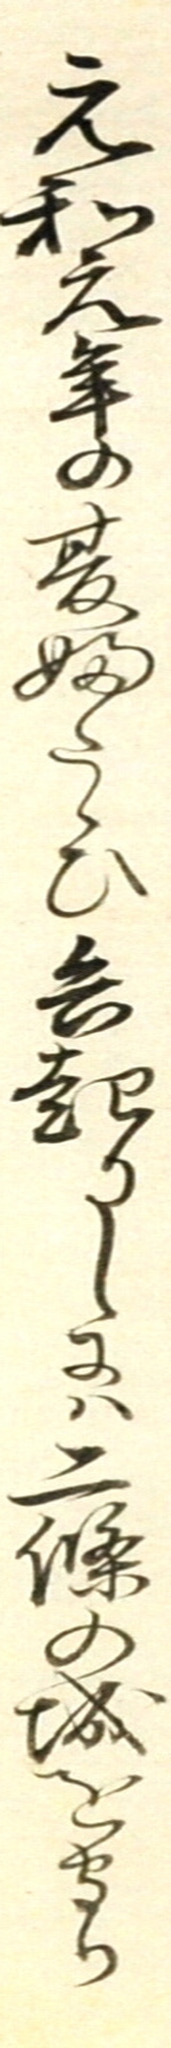元和元年の夏ふたゝひ兵起りしには二条の城を守り
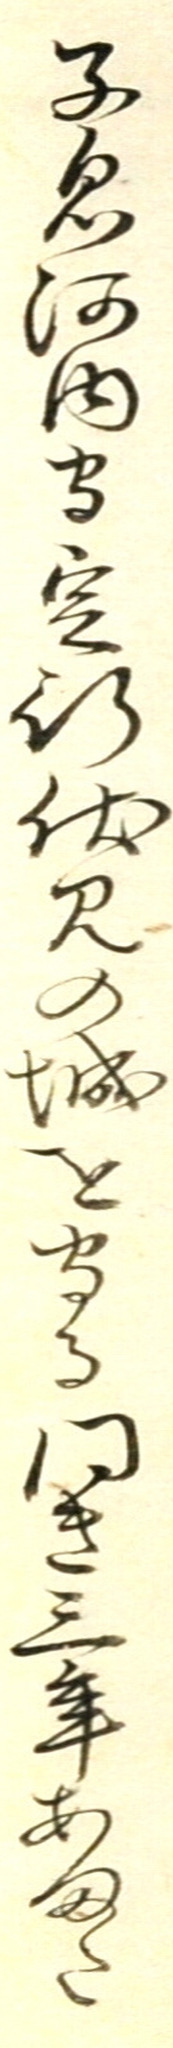子息河内守定行伏見の城を守る同き三年あまた

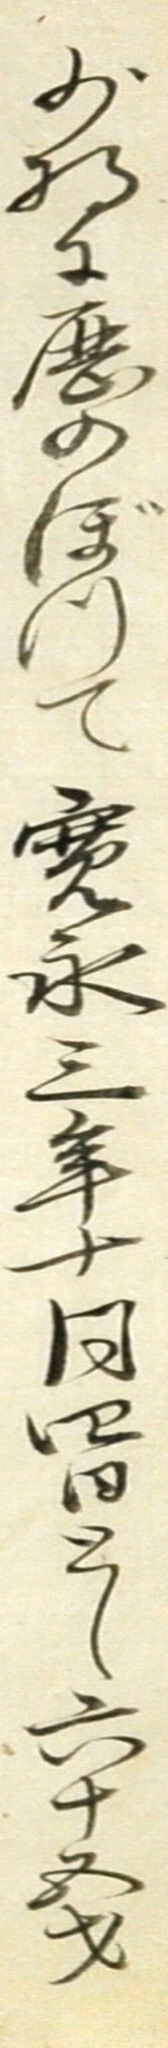少将に歴のぼつて寛永三年十月四日とし六十五才
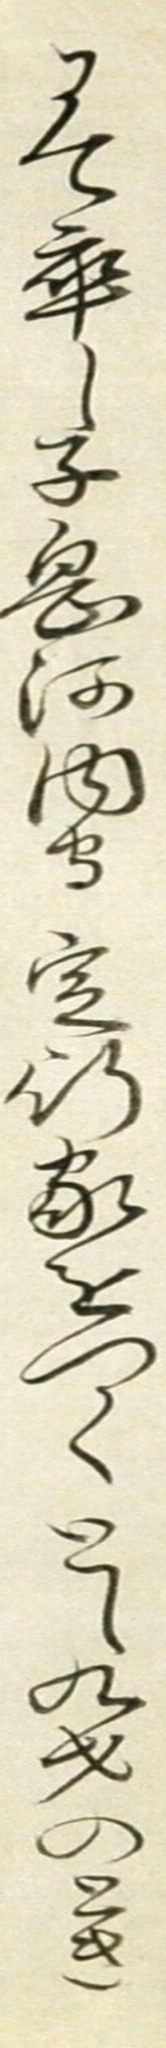にて卒し子息河内守定行家をつくとし九才のとき
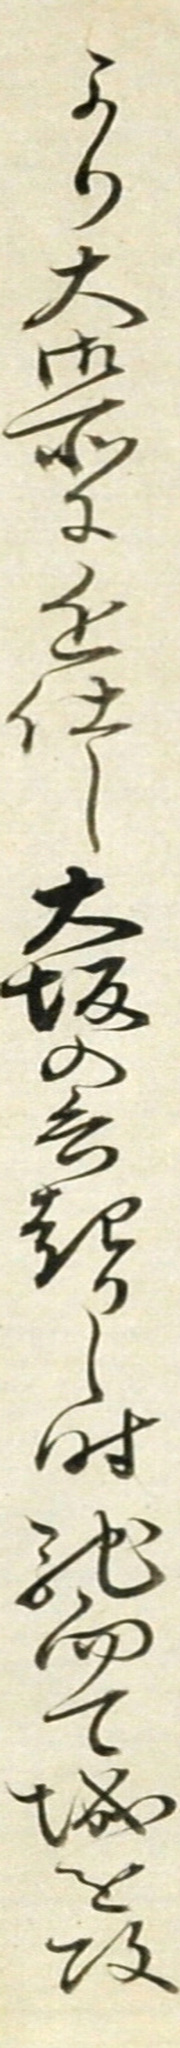より大御所に近仕し大坂の兵起りし時馳向て城を攻
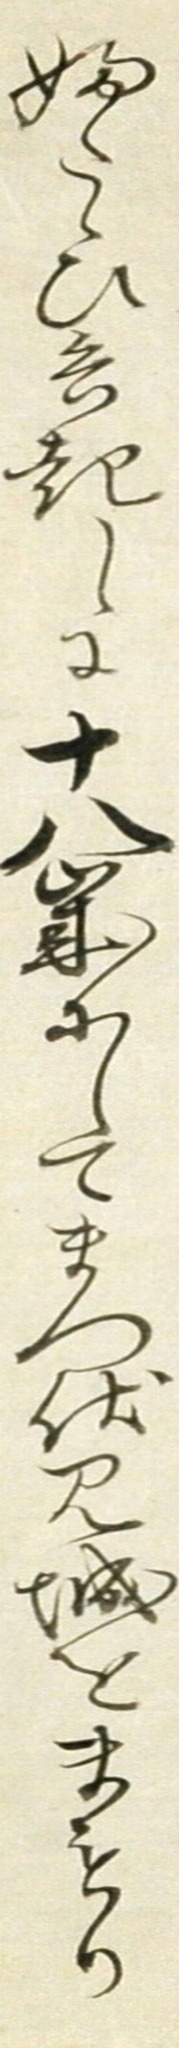ふたゝひ兵起しに十八歳にしてまつ伏見城をまもり
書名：藩翰譜（二・三）
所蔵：伊那市立高遠町図書館・合同会社AMANE
